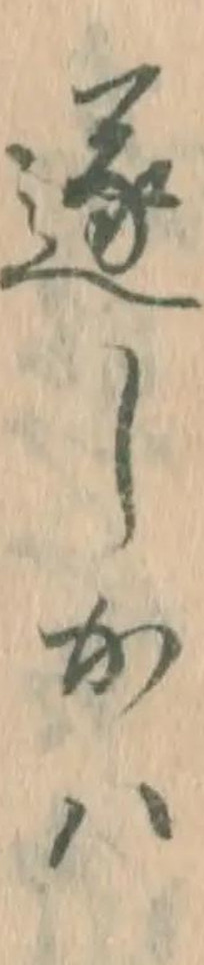遂しかは

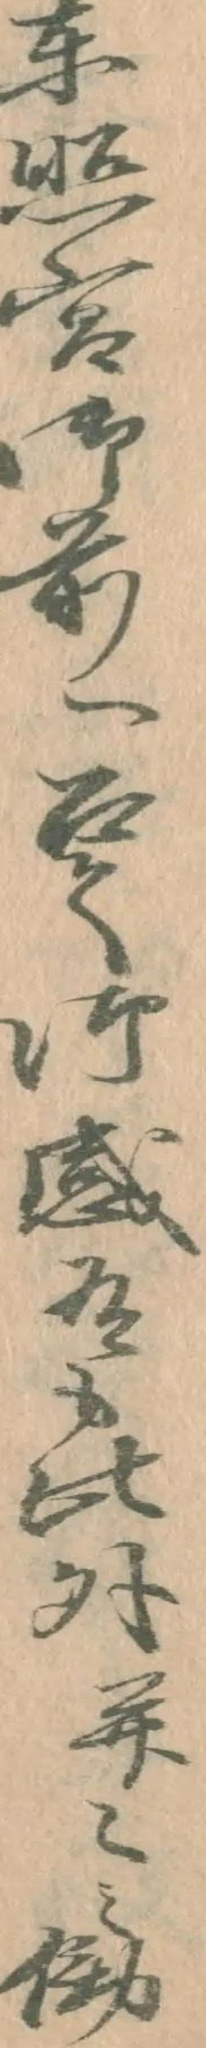東照宮御前へ召て御感有も此外幷々に働
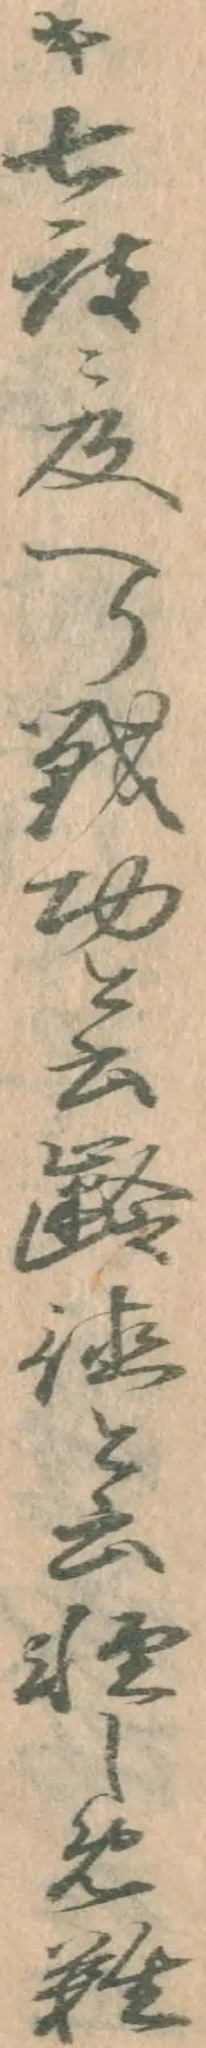き七度に及へり戦功と云齢徳と云軽し免難
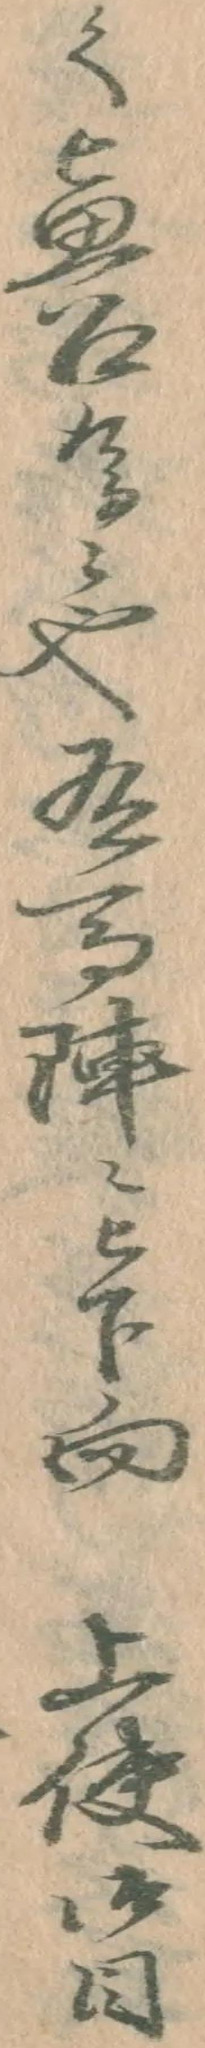て被思召けるにや有馬陣に被下向上使御目
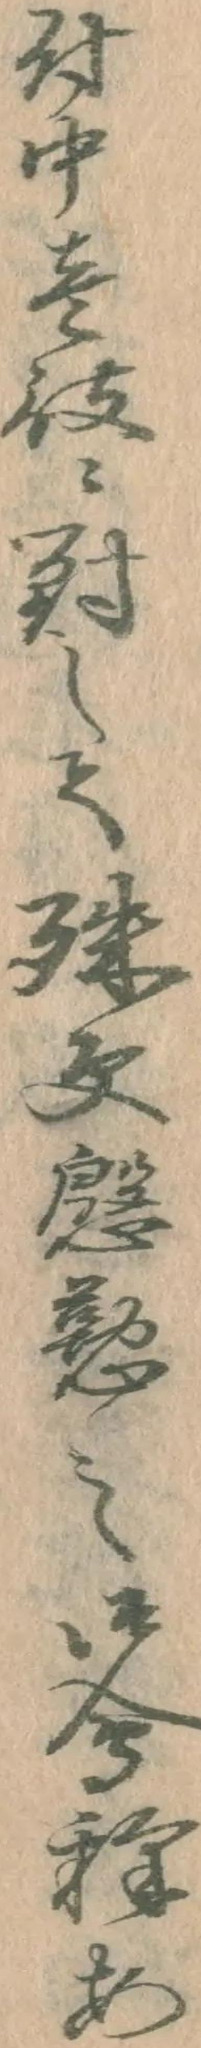付中壱岐に対して殊更慇懃之御会釈あ
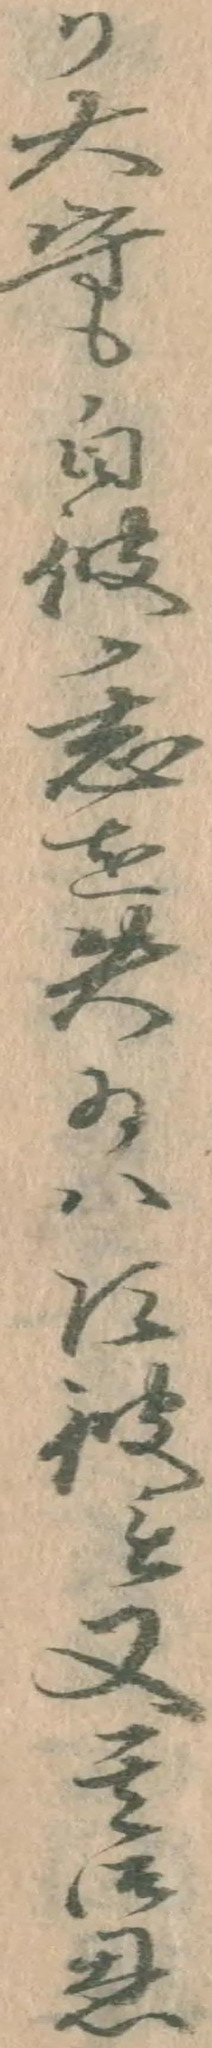り大守も自彼か志を失ゐは須彼と又其御恩
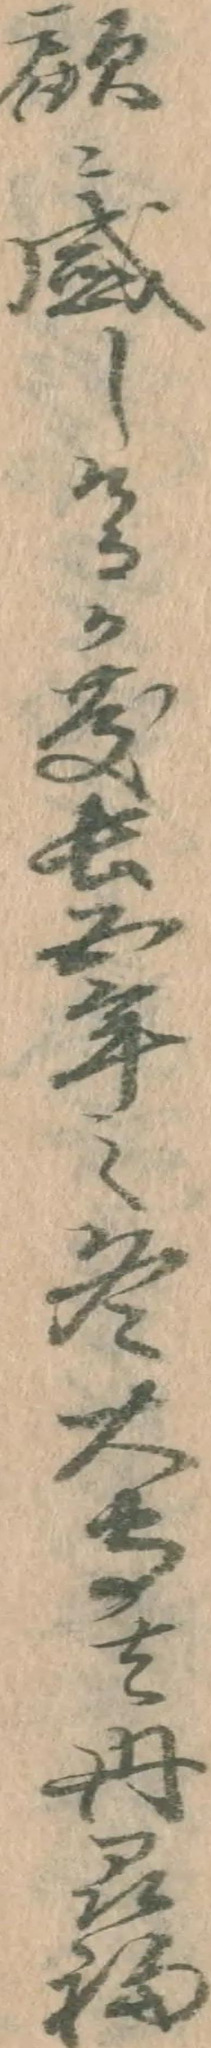顧に感しけるか慶長五年之冬大守者丹州福
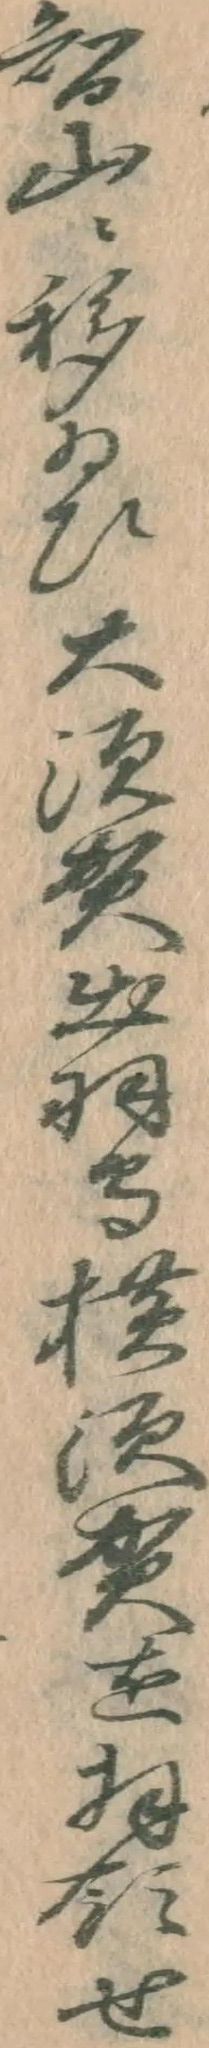智山に移ゐひ大須賀出羽守横須賀を拝領せ
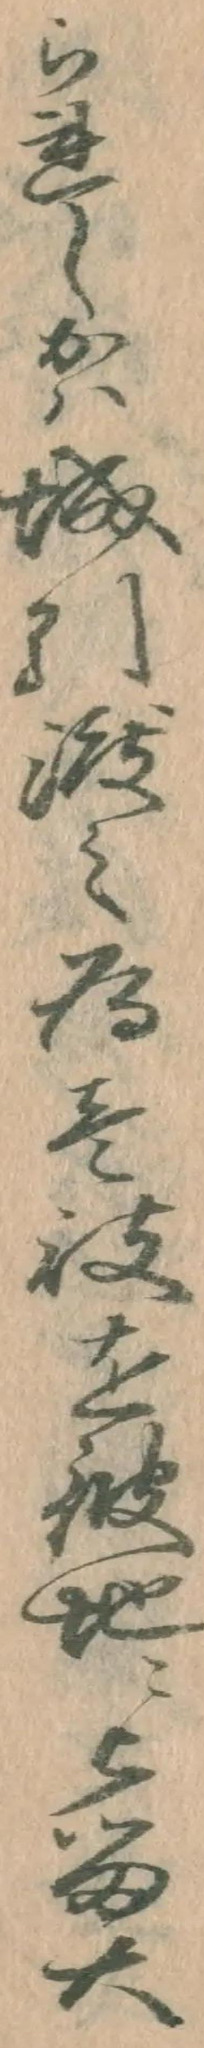ら連しかは城引渡之為壱岐を彼地に被留大
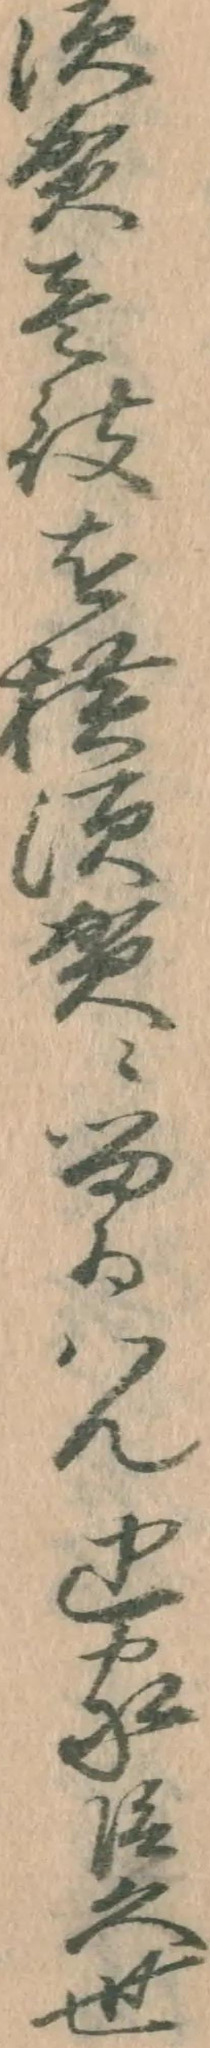須賀壱岐を横須賀に留ゐはん迚家臣久世
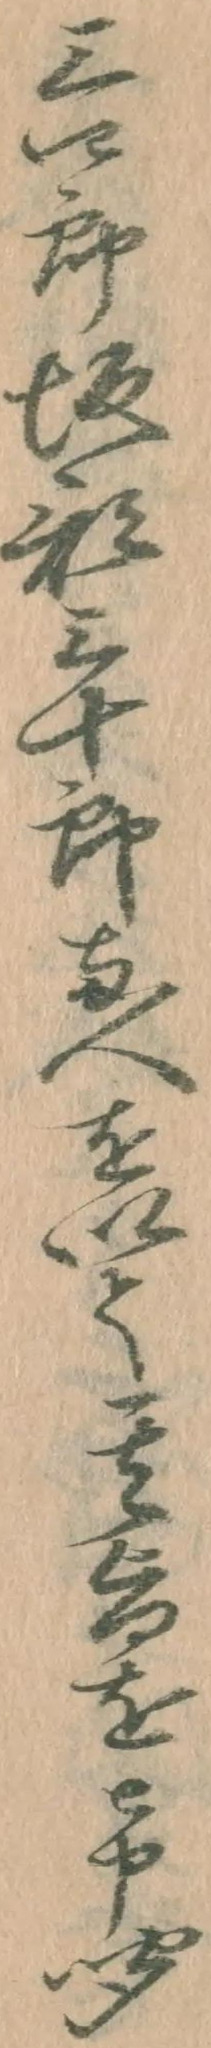三四郎坂部三十郎両人を以て其旨を被申聞
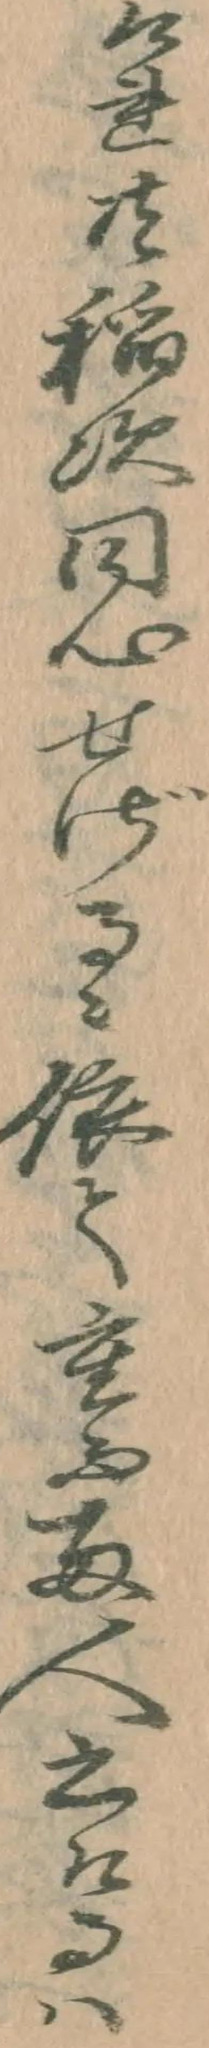け連共稲次同心せざるに依て重而両人云けるは
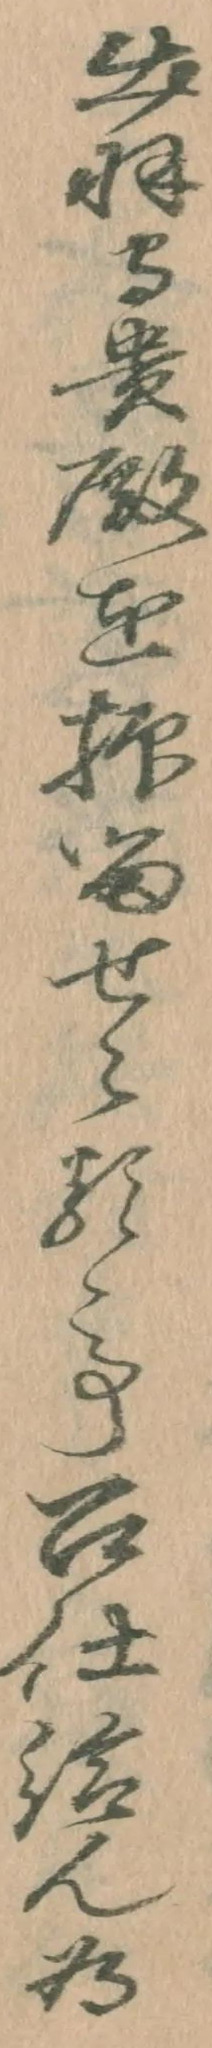出羽守貴殿を抑留せら類々事召仕給ん為
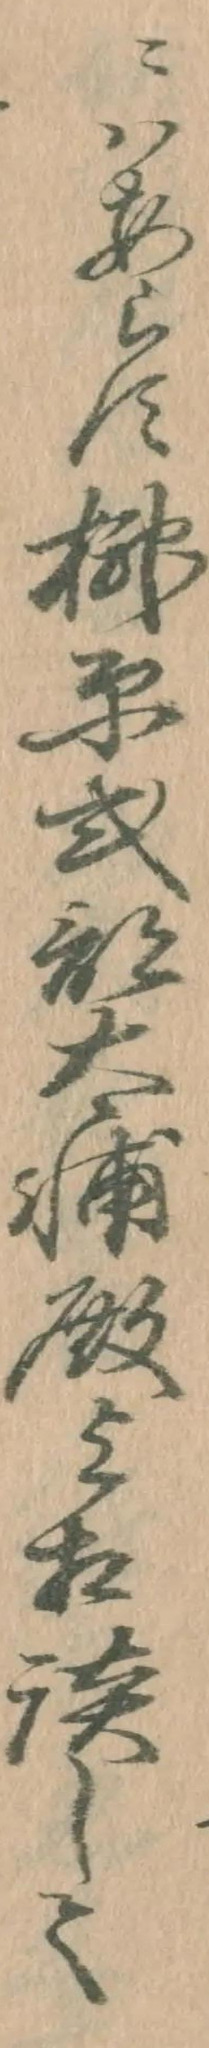にはあら須榊原式部太輔殿与相談して
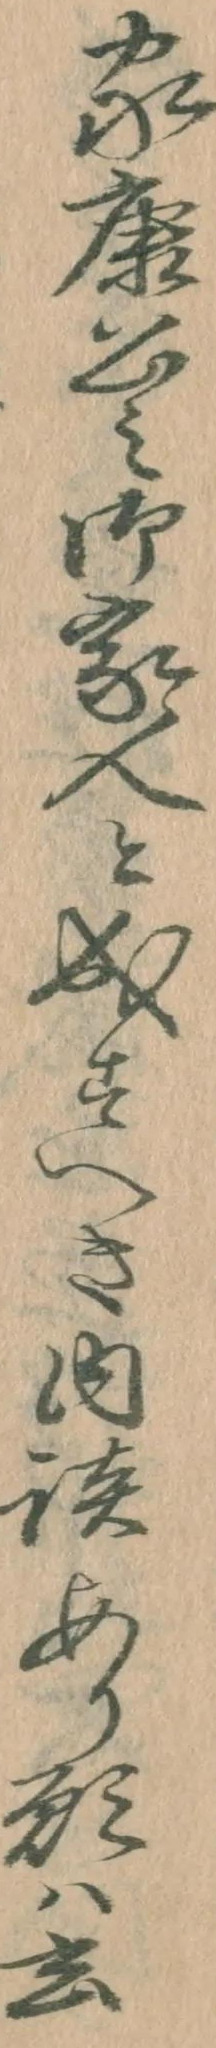家康公之御家人と成春へき内談あり願は玄
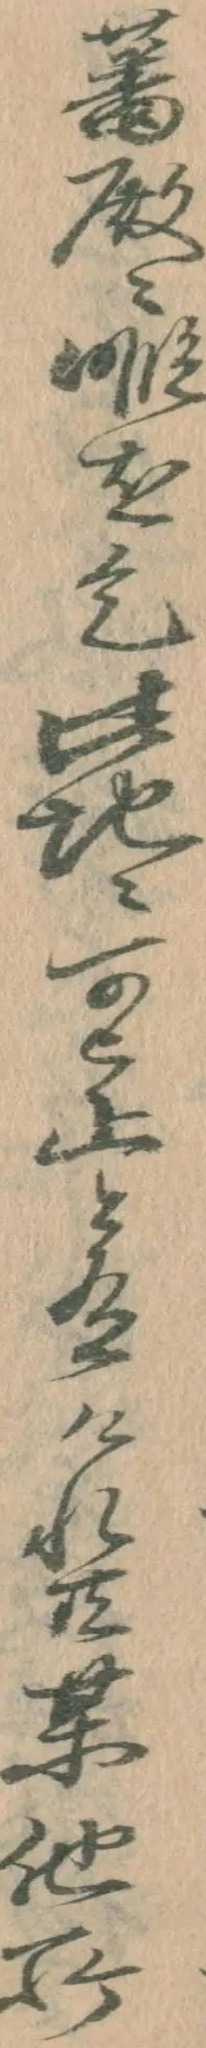蕃殿に暇を乞此地に可被止と有けれ共某他所
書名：切支丹御退治記 49巻. [5]
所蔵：国立国会図書館 National Diet Library, JAPAN
